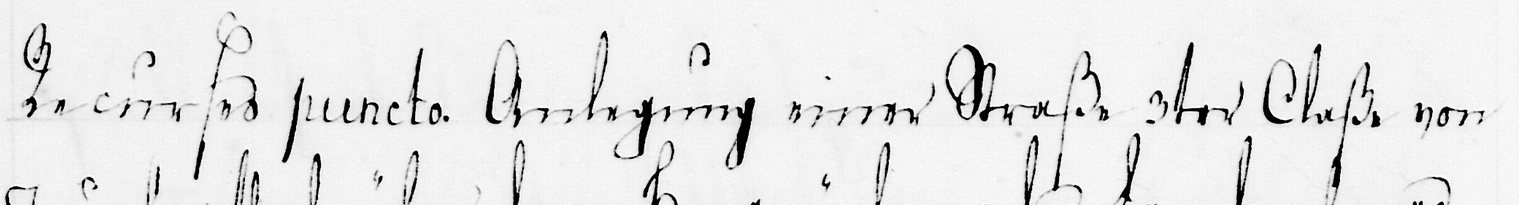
Recurses puncto. Anlegung einer Straße 3ter Claße von
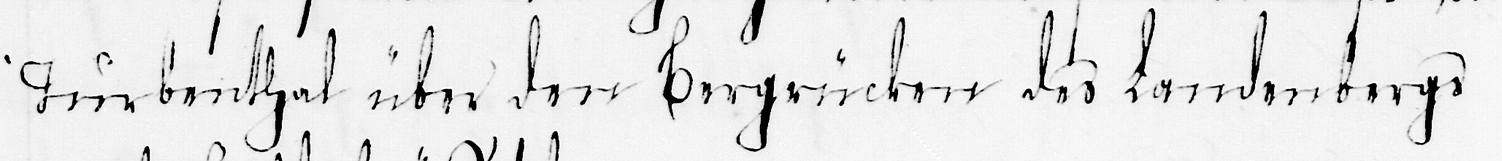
Turbenthal über den Bergrücken des Landenbergs
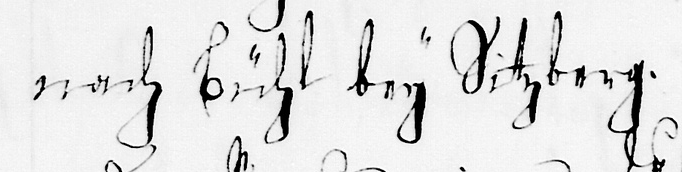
nach Bühl bey Sitzberg.
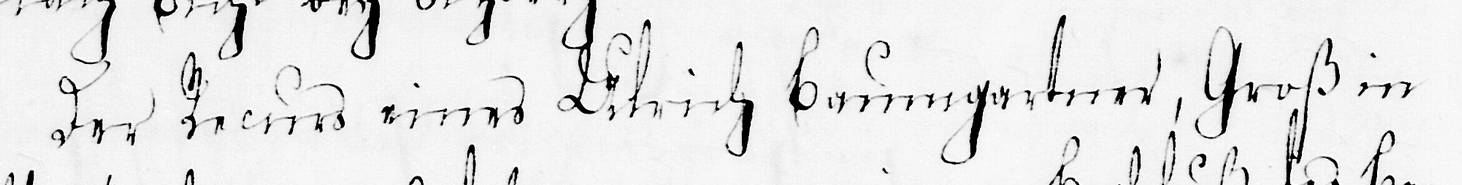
Der Recurs eines Ulrich Baumgartner, Groß in
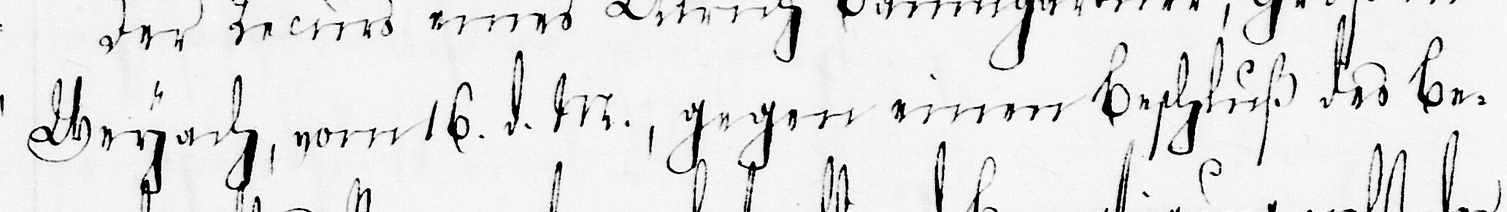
Weyach, vom 16. d. M., gegen einen Beschluß des Be¬
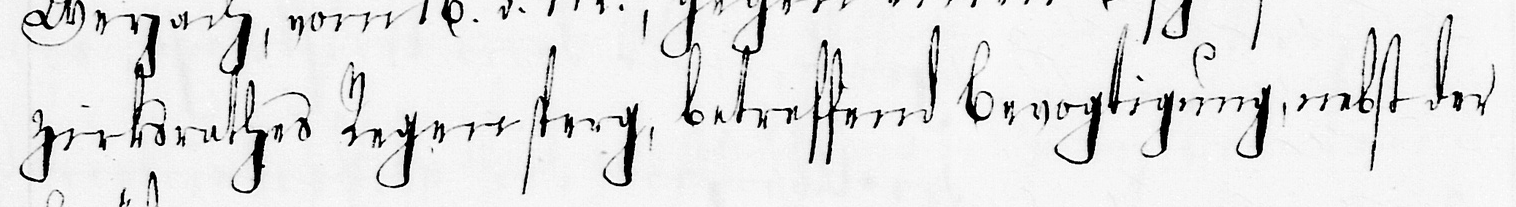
zirksrathes Regensperg, betreffend Bevogtigung, nebst der
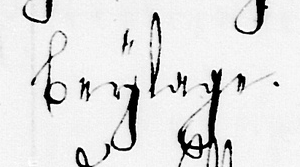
Beylage.
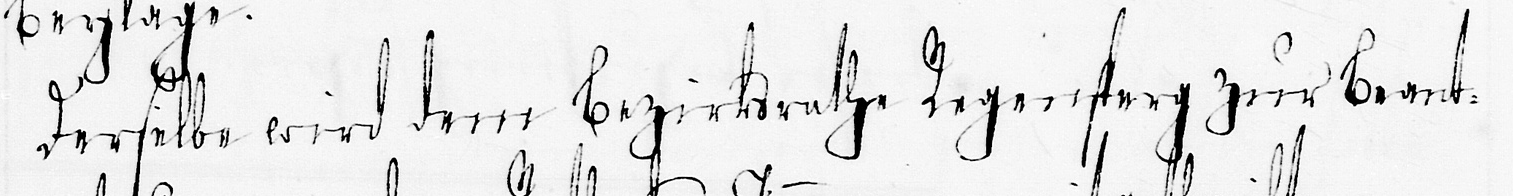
Derselbe wird dem Bezirksrathe Regensperg zur Beant¬
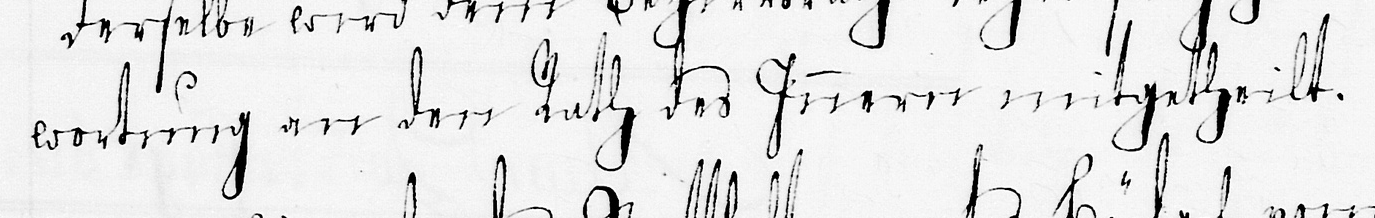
wortung an den Rath des Innern mitgetheilt.
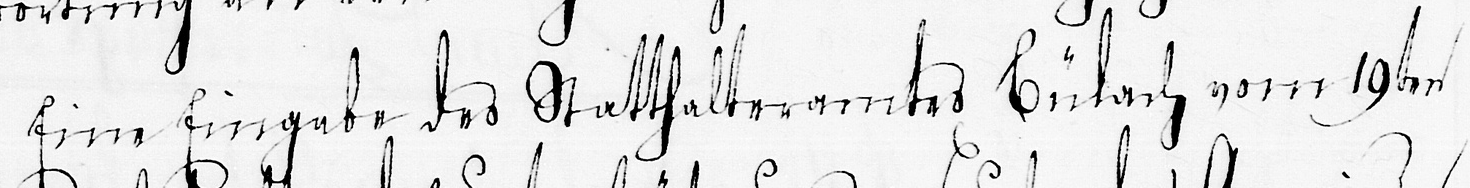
Eine Eingabe des Statthalteramtes Bülach vom 19ten
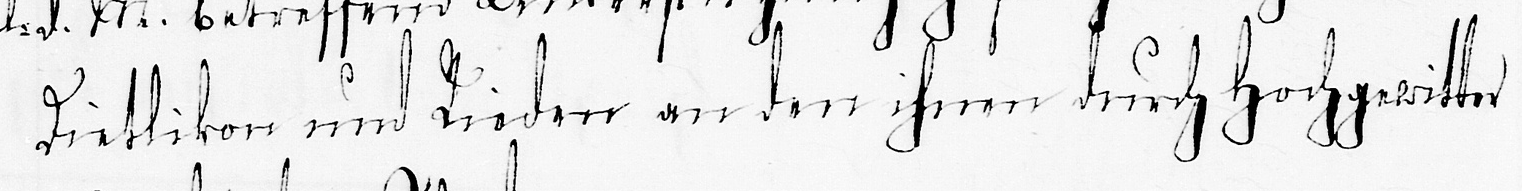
Dietlikon und Rieden an den ihnen durch Hochgewit¬
